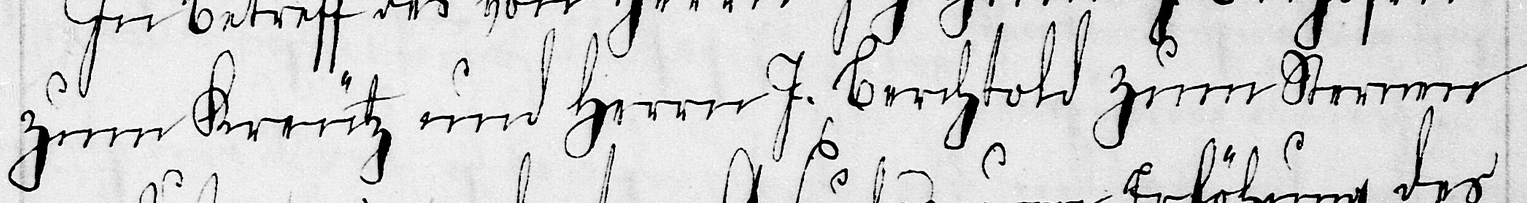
zum Kreutz und Herrn J. Berchtold zum Sternen
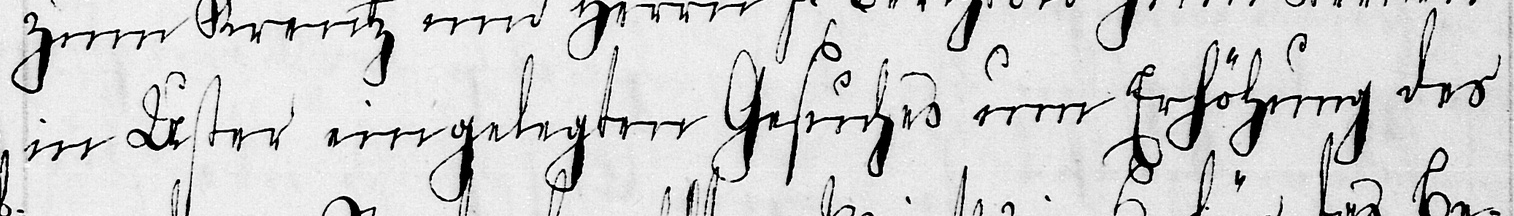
in Uster eingelegten Gesuches um Erhöhung des
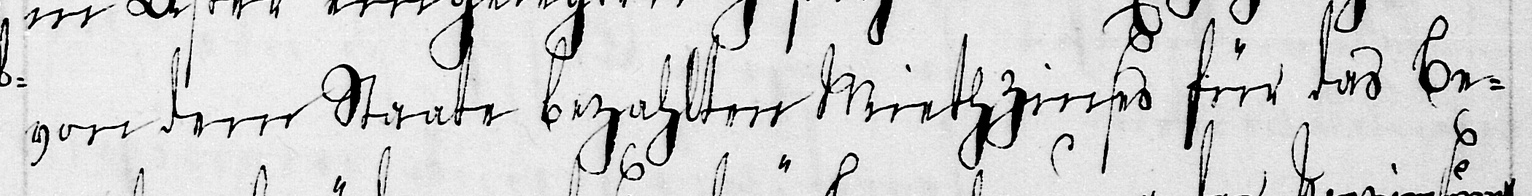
von dem Staate bezahlten Miethzinses für das Be¬
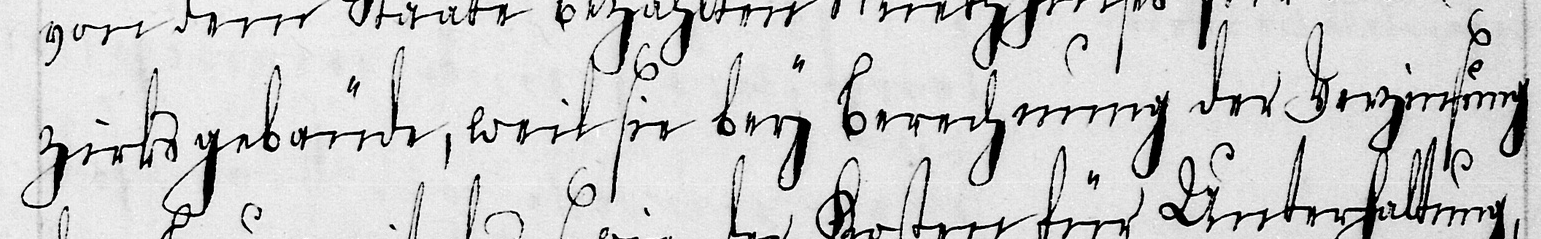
zirksgebäude, weil sie bey Berechnung der Verzinsung
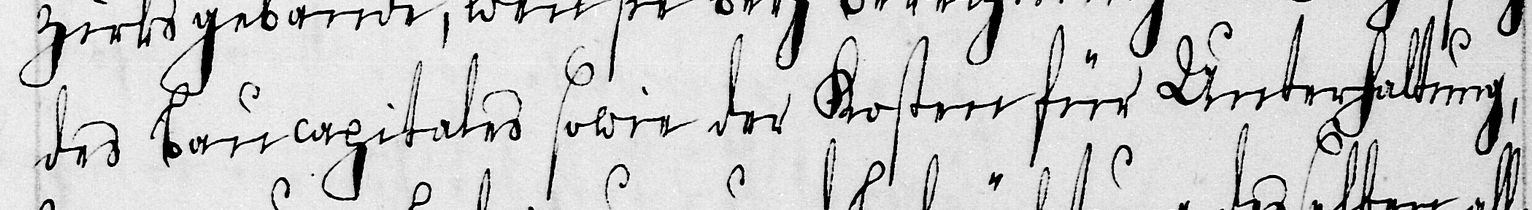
des Baucapitales sowie der Kosten für Unterhaltung,
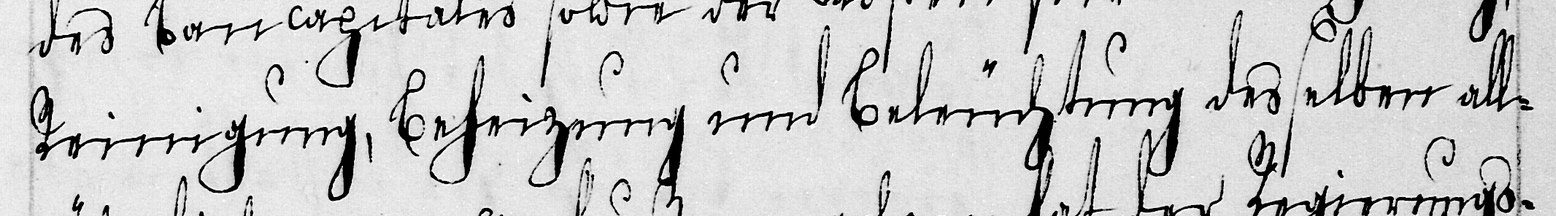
Reinigung, Beheizung und Beleuchtung desselben al¬
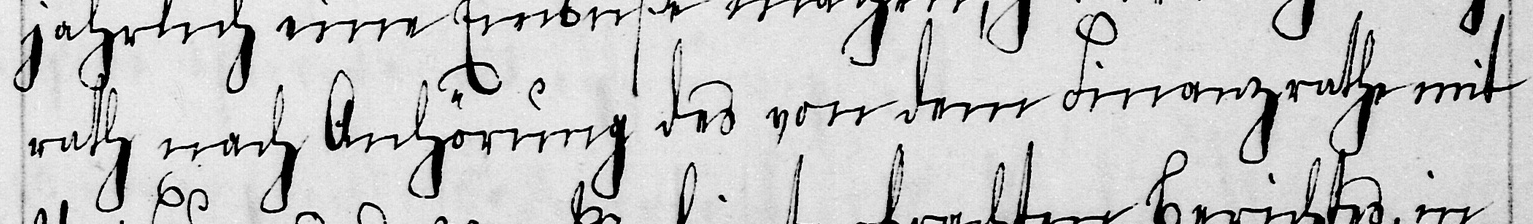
rath nach Anhörung des von dem Finanzrathe mit
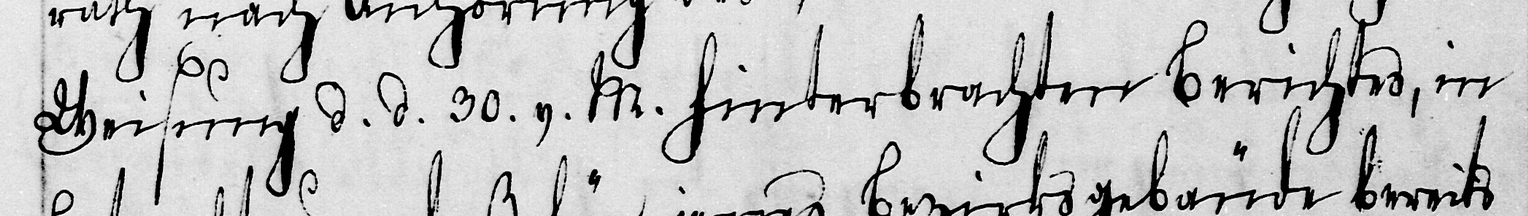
Weisung d. d. 30. v. M. hinterbrachten Berichtes, in
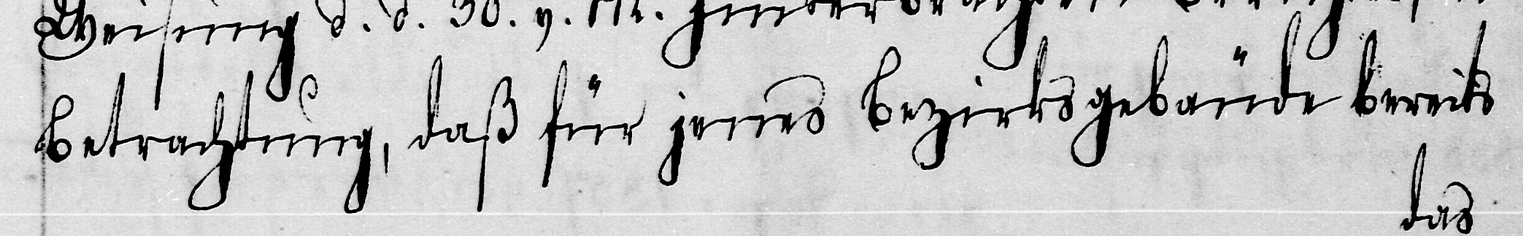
Betrachtung, daß für jenes Bezirksgebäude bereits
